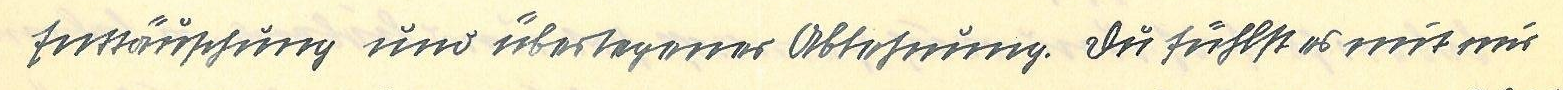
Enttäuschung und überlegener Ablehnung. Du fühlst es mit mir
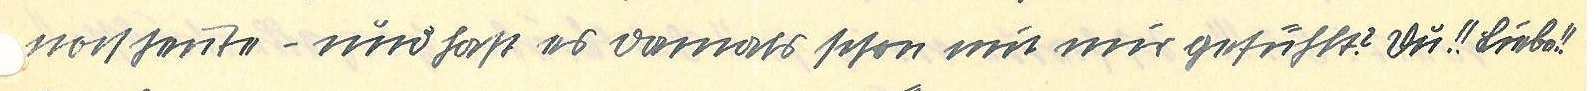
noch heute – und hast es damals schon mit mir gefühlt? Du!! Liebe!!
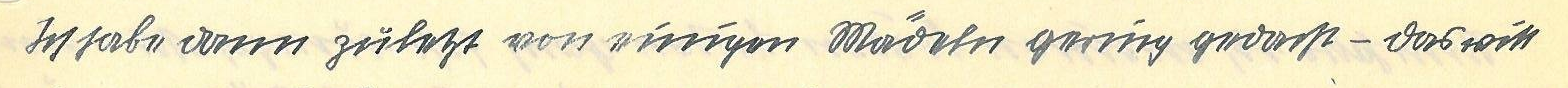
Ich habe dann zuletzt von einigen Mädeln gering gedacht – das will
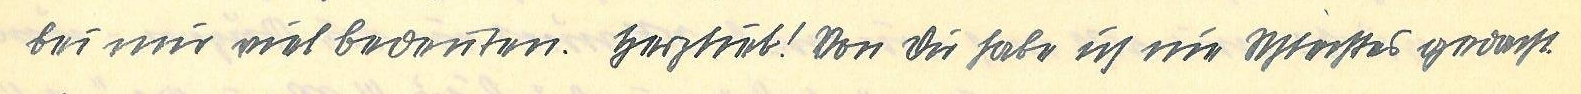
bei mir viel bedeuten. Herzlieb! Von Dir habe ich nie Schlechtes gedacht.
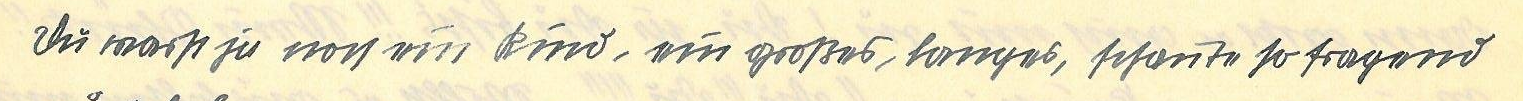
Du warst ja noch ein Kind, ein großes, langes, schaute so fragend
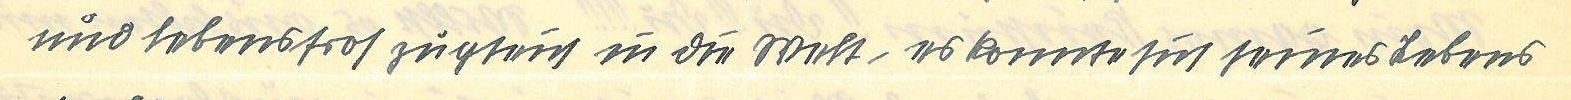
und lebensfroh zugleich in die Welt, es konnte sich seines Lebens
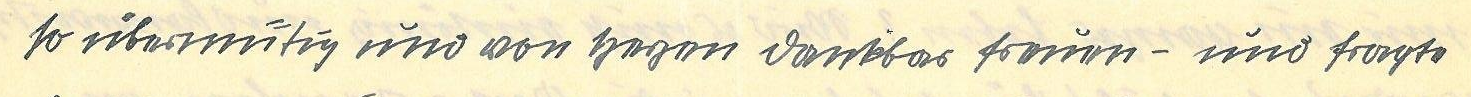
so übermütig und von Herzen dankbar freuen – und fragte
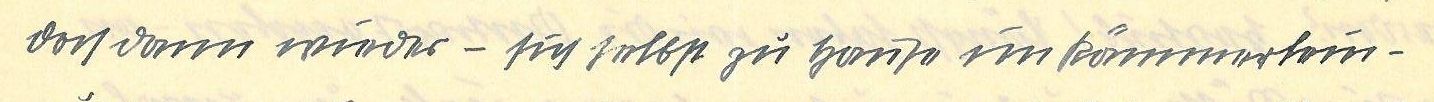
doch dann wieder – sich selbst zu Hause im Kämmerlein –
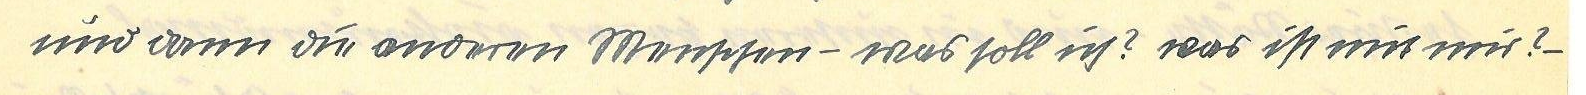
und dann die anderen Menschen – was soll ich? was ist mit mir? –
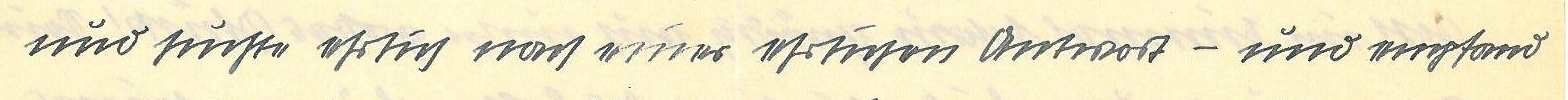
und suchte ehrlich nach einer ehrlichen Antwort – und empfand
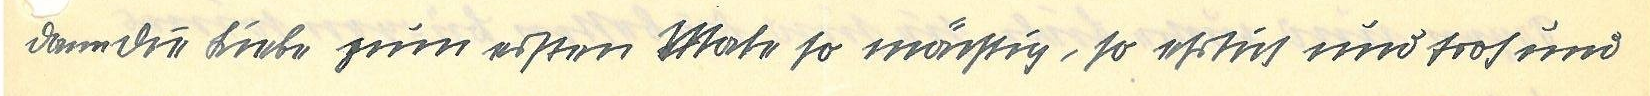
dann die Liebe zum ersten mMale so mächtig, so ehrlich und froh und
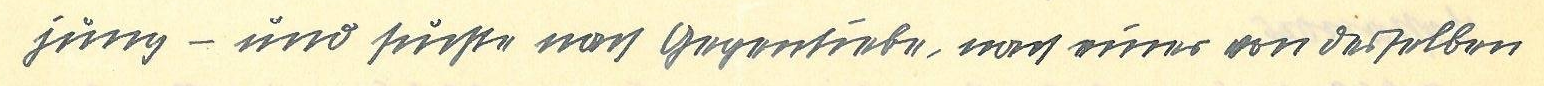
jung – und suchte nach Gegenliebe, nach einer von derselben
